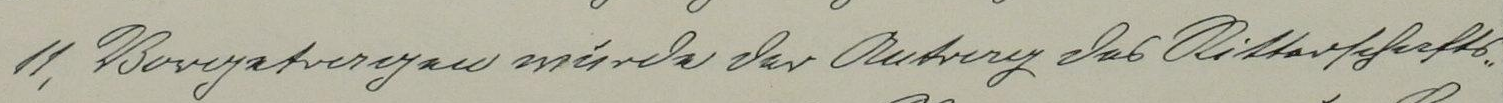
11. Vorgetragen wurde der Antrag des Ritterschafts-
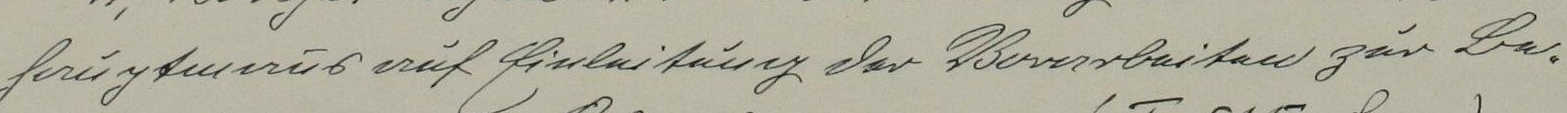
hauptmanns auf Einleitung der Vorarbeiten zur Be-
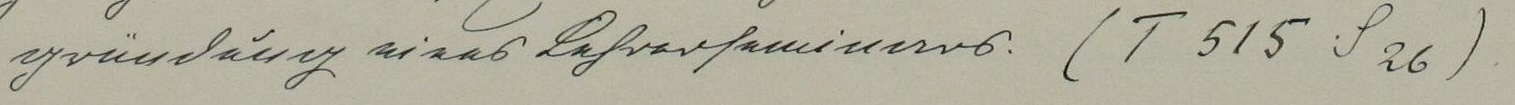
gründung eines Lehrerseminars. (T 515 S 26).
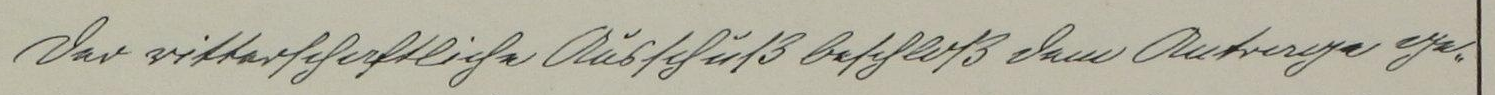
Der ritterschaftliche Ausschuß beschloß dem Antrage ge-
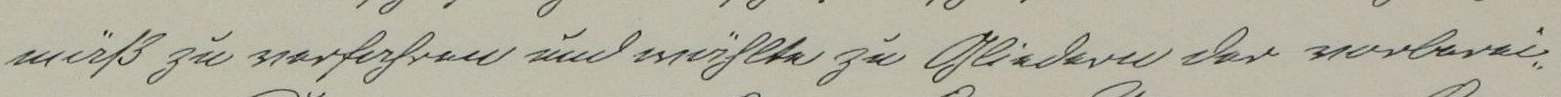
mäß zu verfahren und wählte zu Gliedern der vorberei-
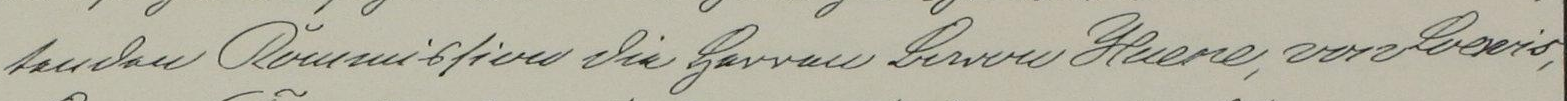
tenden Kommission die Herren Baron Huene, von Loewis,
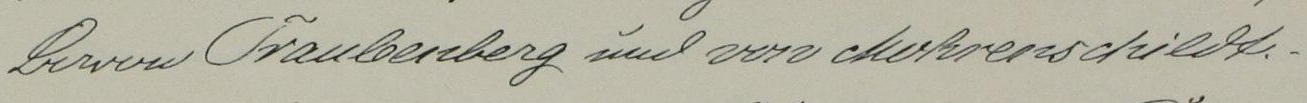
Baron Traubenberg und von Mohrenschildt.
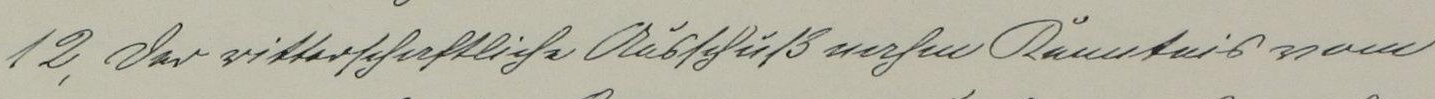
12. Der ritterschaftliche Ausschuß nahm Kenntnis vom
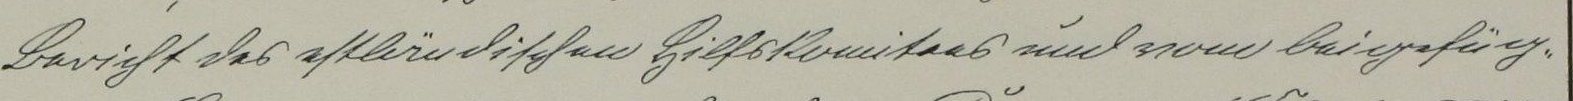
Bericht des estländischen Hilfskomitees und vom beigefüg-
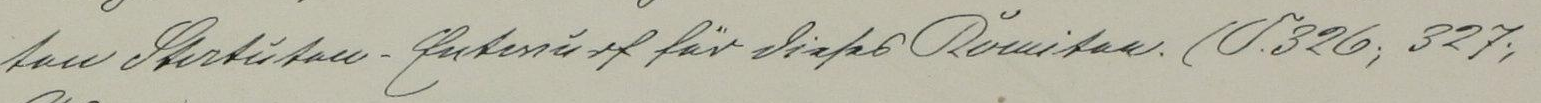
ten Statuten-Entwurf für dieses Komitee. (T.326; 327;
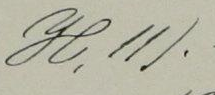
H.11).
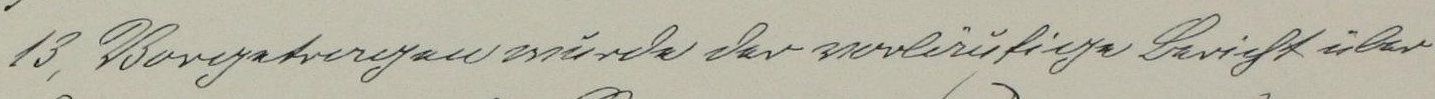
13. Vorgetragen wurde der vorläufige Bericht über
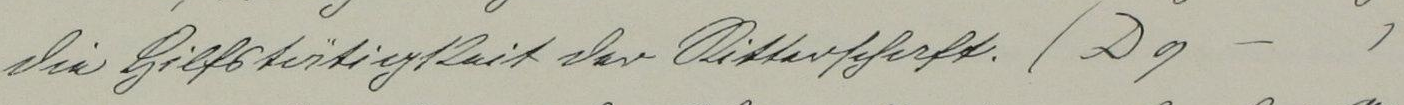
die Hilfstätigkeit der Ritterschaft (D.9 - ).
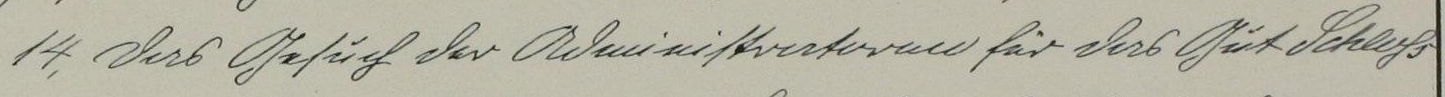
14. Das Gesuch der Administratoren für das Gut Schloss-
